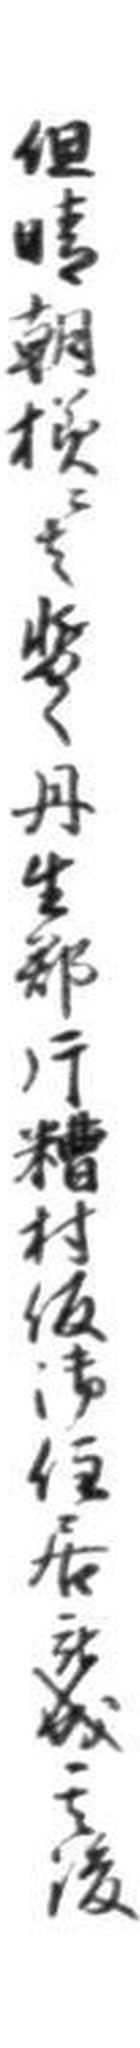但晴朝様ニ者暫く丹生郡片糟村仮御住居被成其後
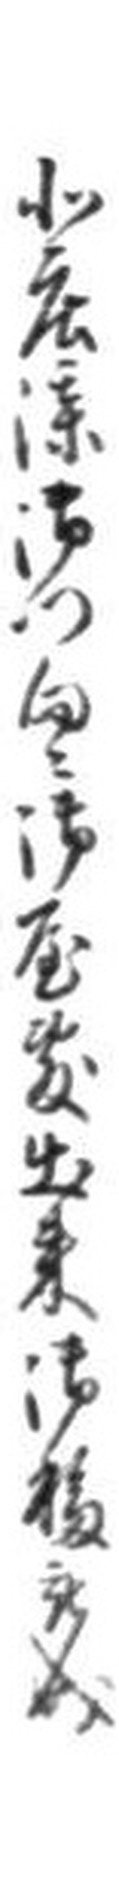北庄漆御門向ニ御屋敷出来御移被成
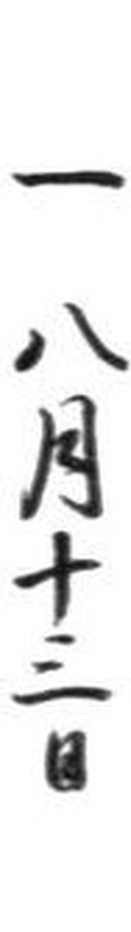一八月十三日
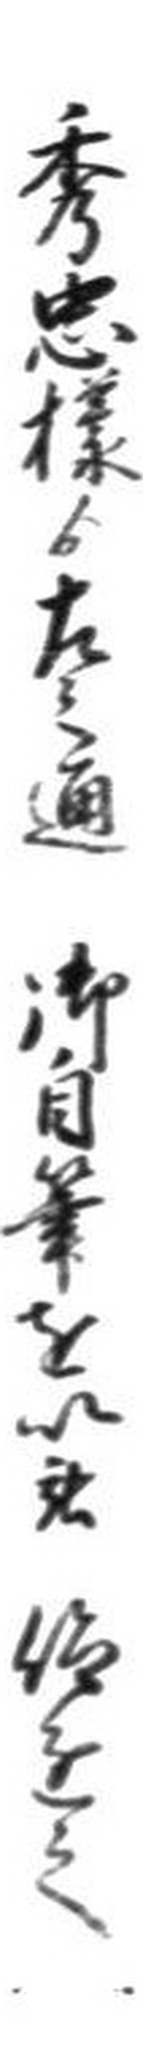秀忠様ゟ左之通御自筆を以被仰進之
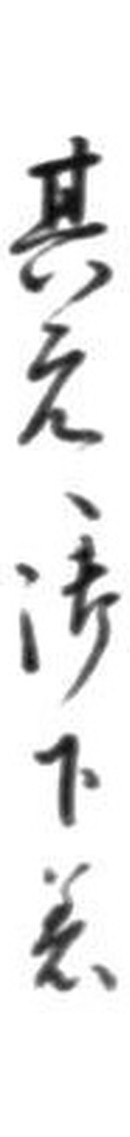其許へ御下着
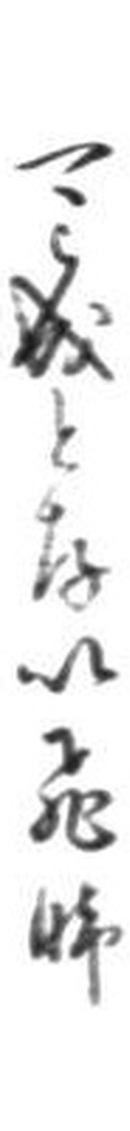可被成と存以飛脚
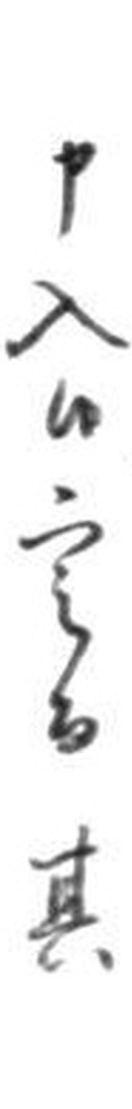申入候定而其
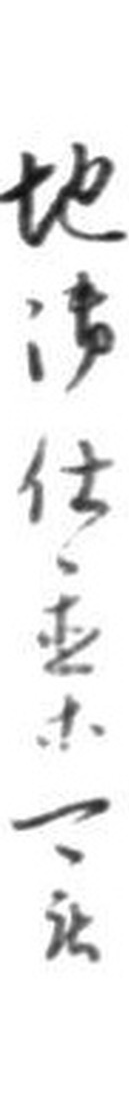地御仕置等可被
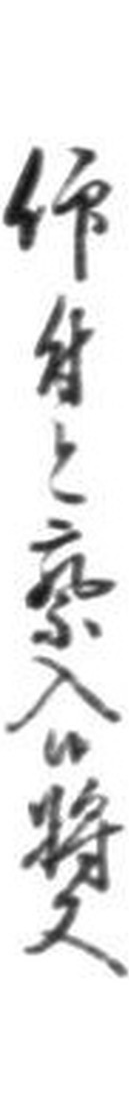仰付と察入候将又
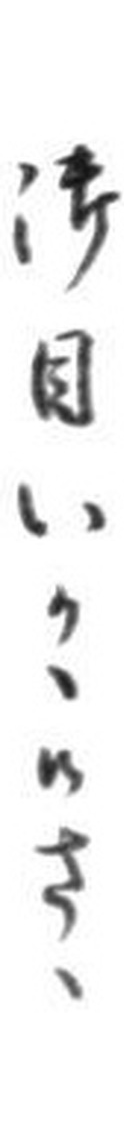御目いかゝ御さ候
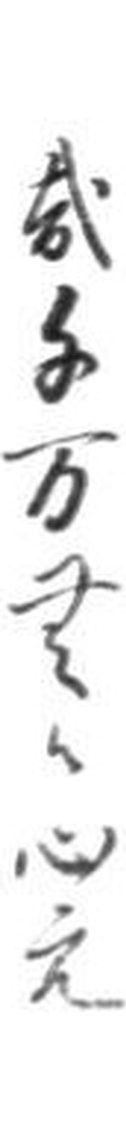哉千万無御心元

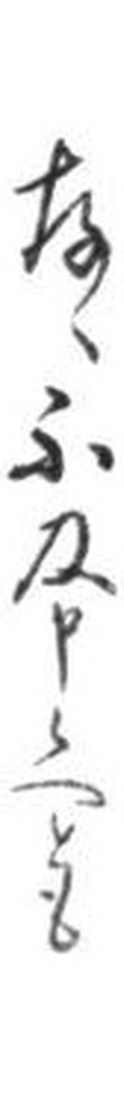存候不及申候へとも
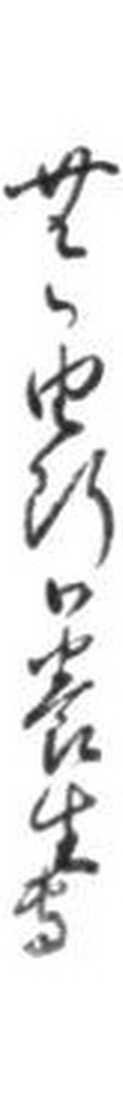無御由断御養生専
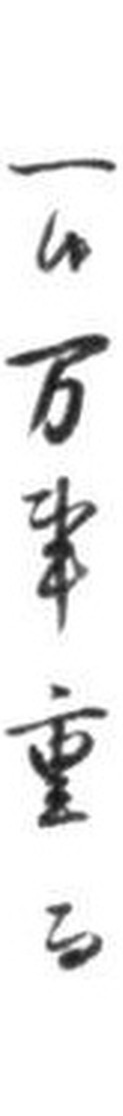一候万事重而
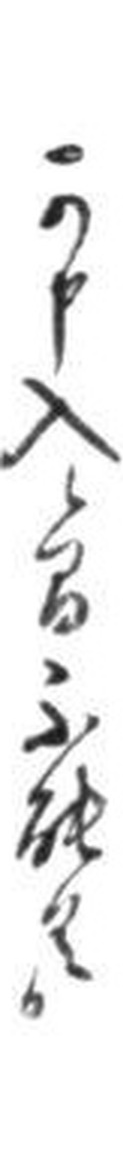可申入候間不能具候
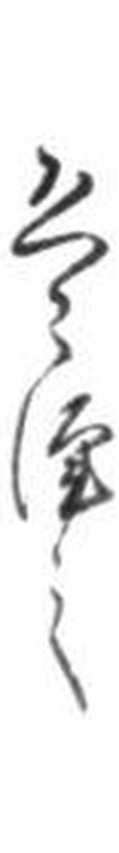恐々謹言
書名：家譜 一 秀康公 従天正二年到慶長十二年
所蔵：福井県文書館 Fukui Prefectural Archives
